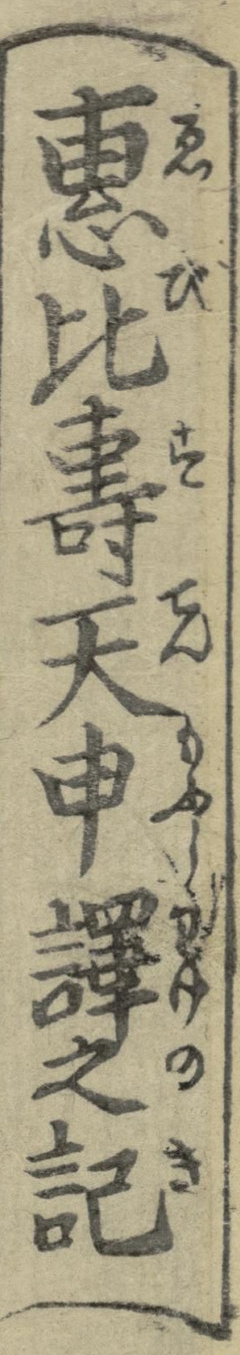恵比寿天申訳之記
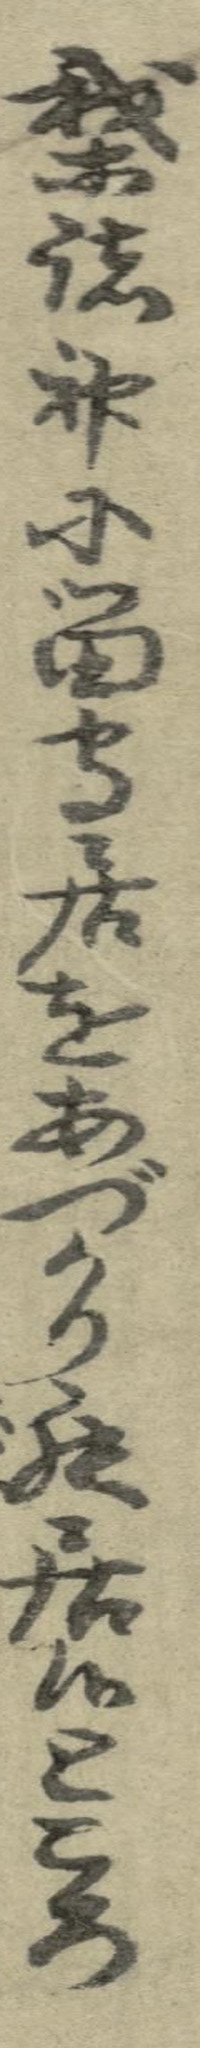我等諸神に留守居をあづかり罷居候ところ
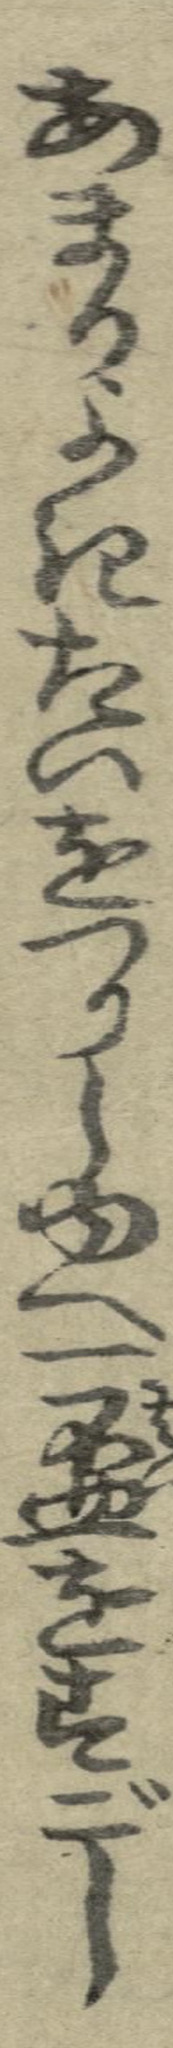あまりよきたいをつりしゆへ一盃をすごし
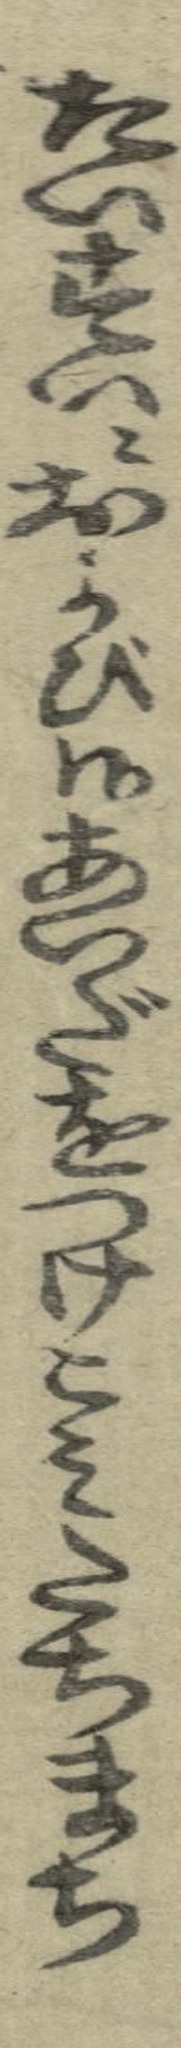たいすいにおよび候あいだをつけこみたちまち
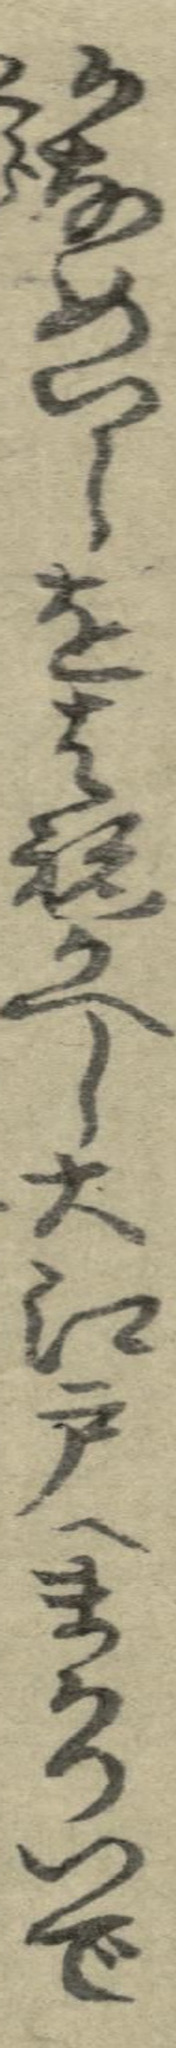かなめいしをはねかへし大江戸へまかりいで
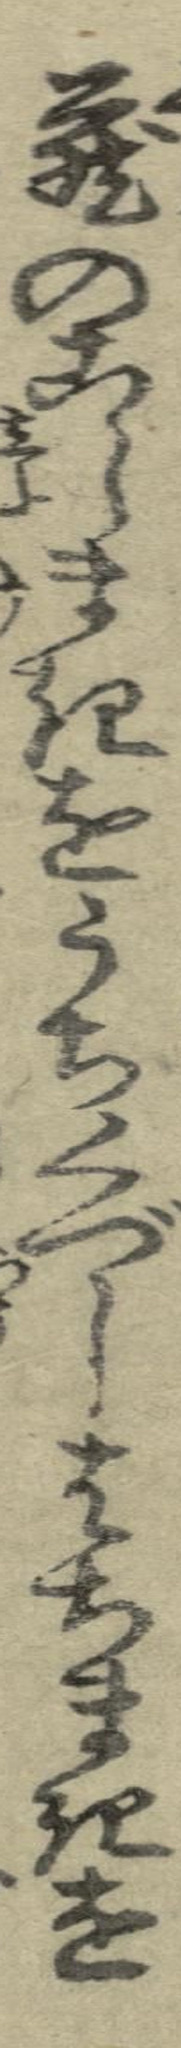蔵のこしまきをうちくづしはちまきを
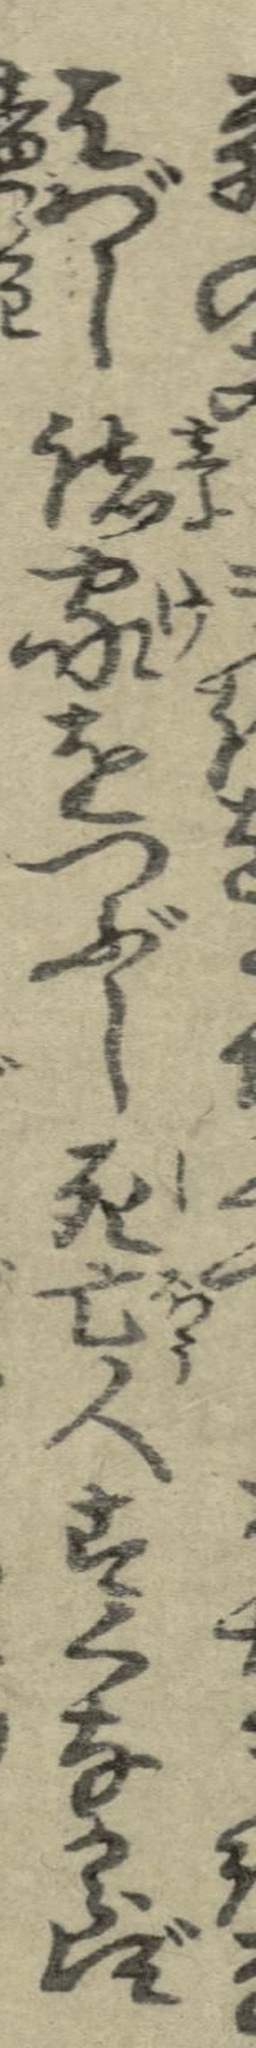はづし諸家をつぶし死亡人すくなからず
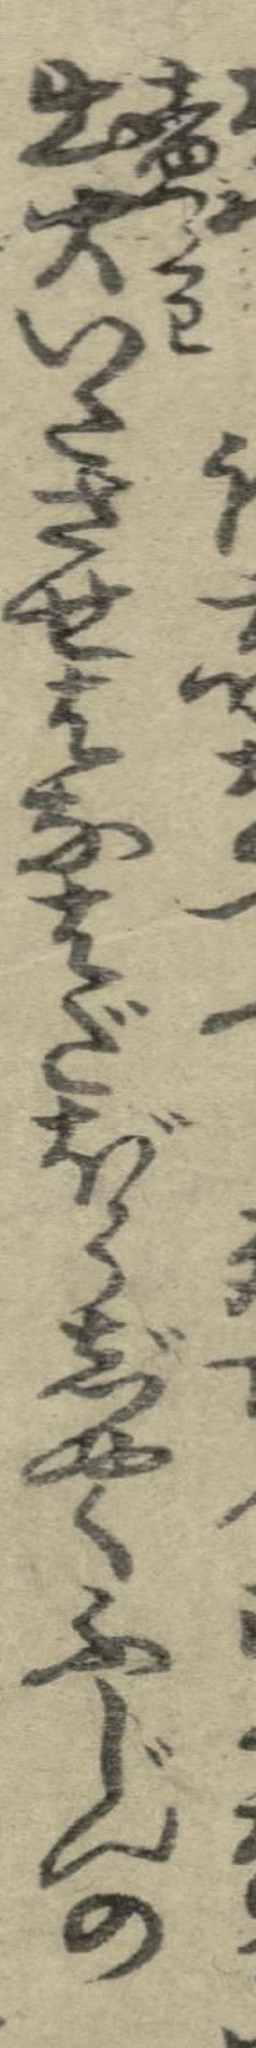出火いたさせはなはだぼうじやくふじんの
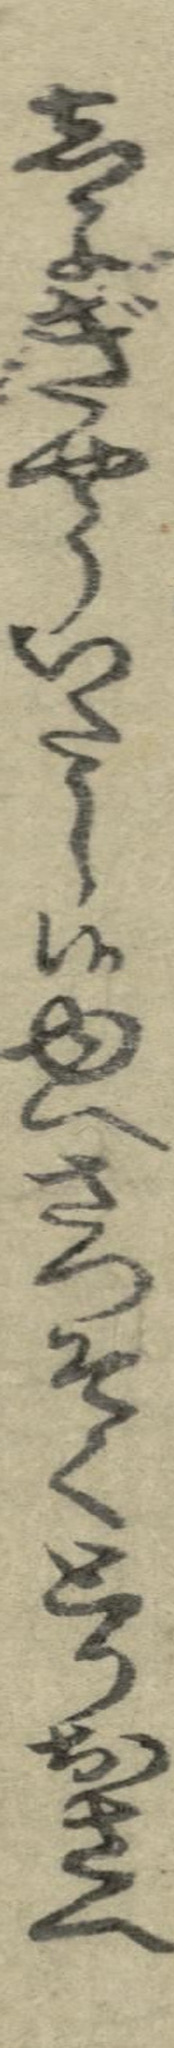しよぎやういたし候ゆへさつそくとりおさへ
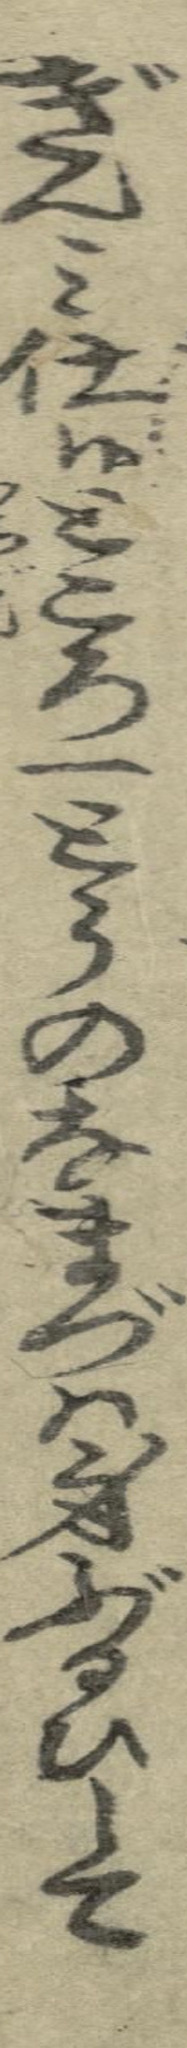ぎんみ仕候ところ一とうのなまづは身ぶるひして
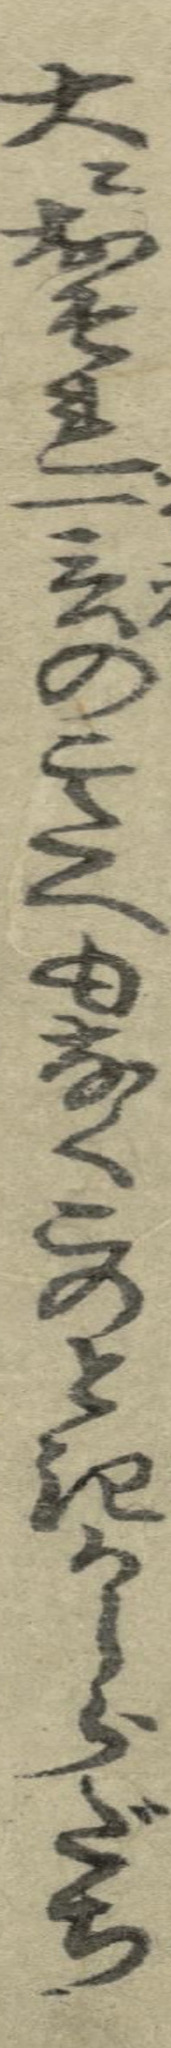大におそれ一言のこたへもなくこのときかしらだち
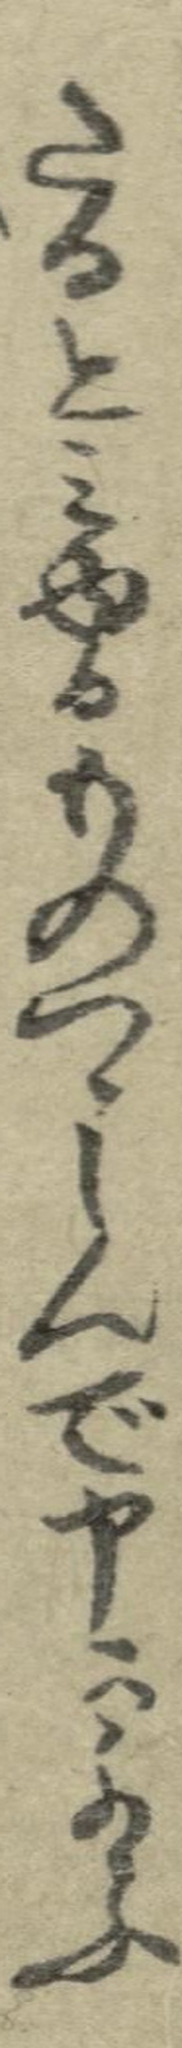たるとみゆるものつゝしんで申すよふ
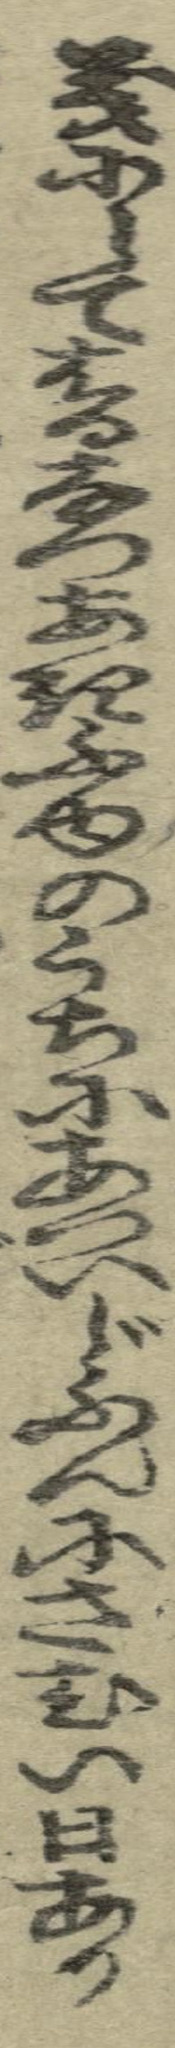義にしてはるなつあきふゆのうちにあついじふんにさむい日あり
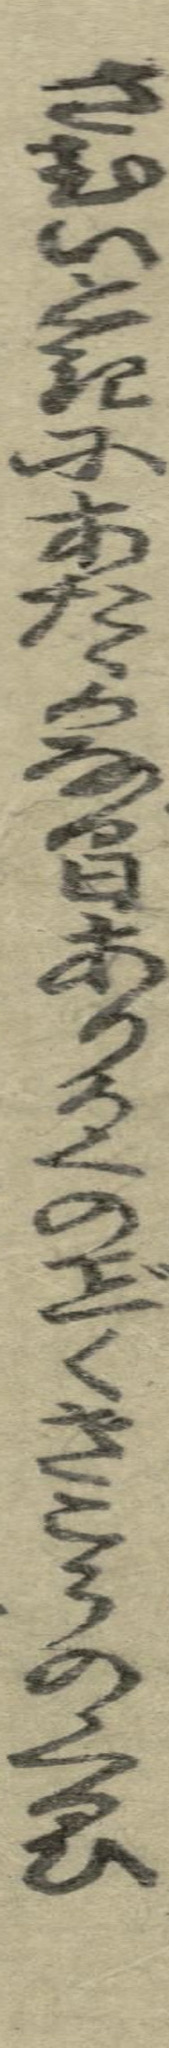さむいときにあたゝかなる日ありかくのごとくきこうのくるひ
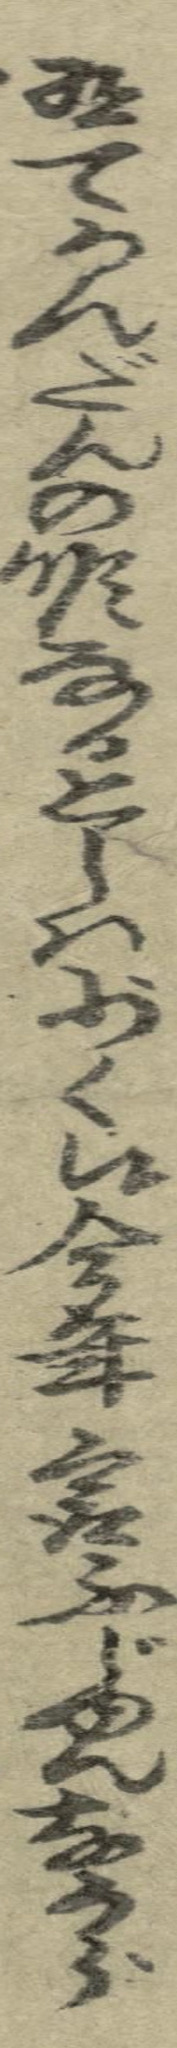有てかんだんの順なるとしは少く候今年最ふじゆんなから
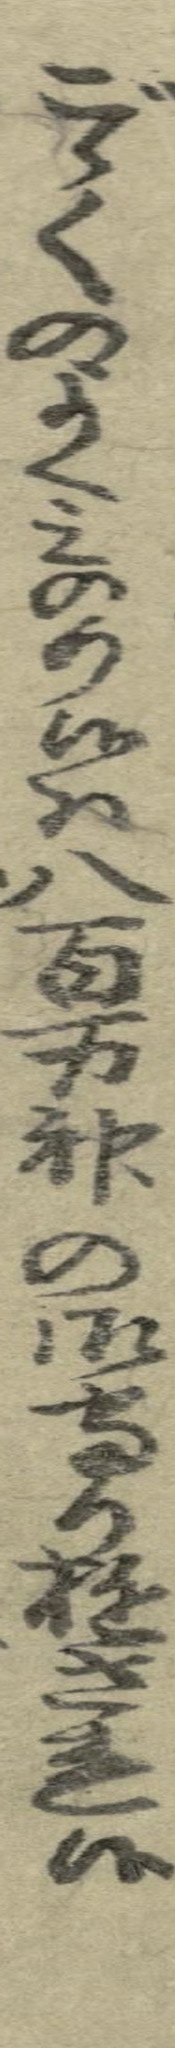ごゝくのよくみのり候は八百万神の御守り遊され候
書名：恵比壽天申譯之記
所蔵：東京大学地震研究所図書室 Earthquake Research Institute Library, The University of Tokyo, JAPAN
